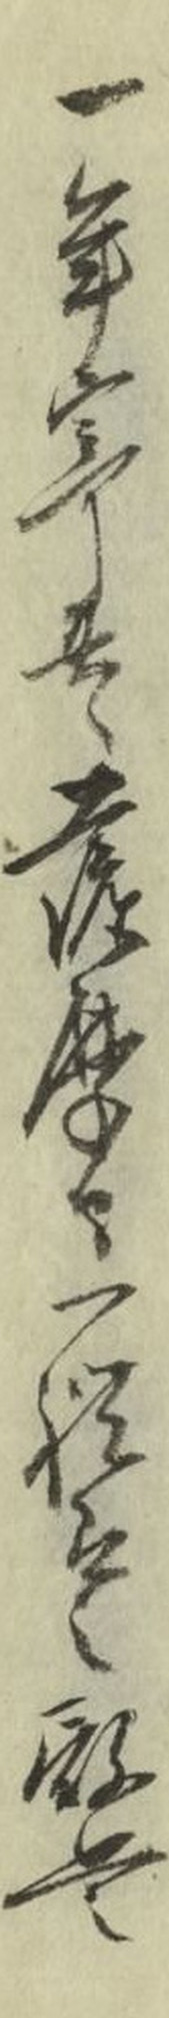一年寄共へ薩摩守一礼有之殿上之
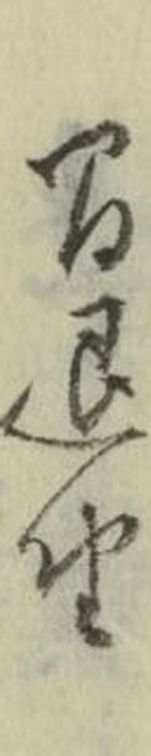間退坐
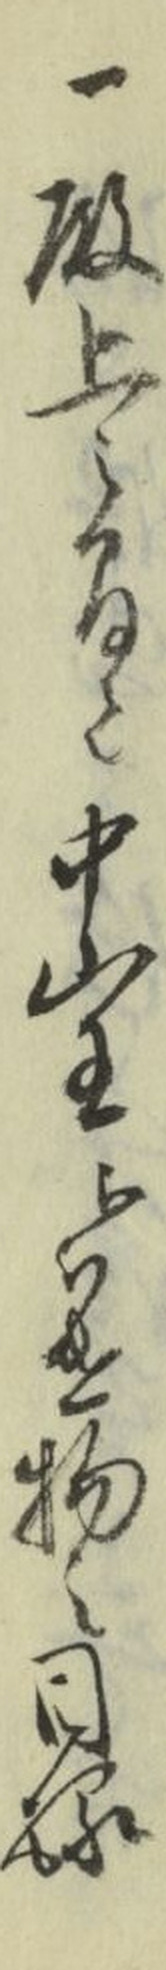一殿上之間に而中山王え被遣物之目録
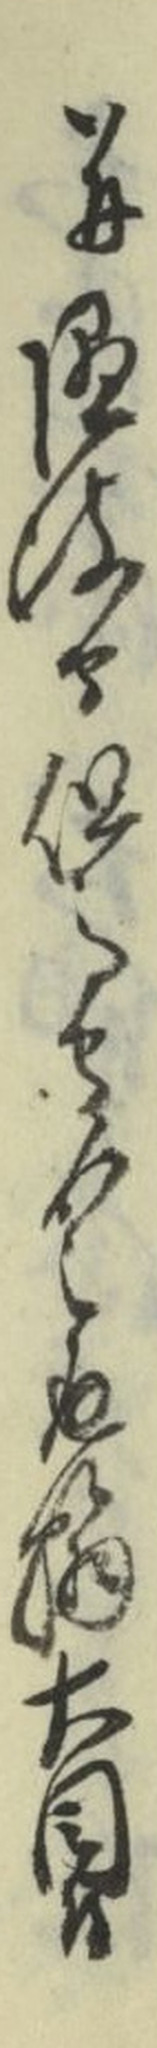幷隠岐守但馬守ゟ之返翰大目付
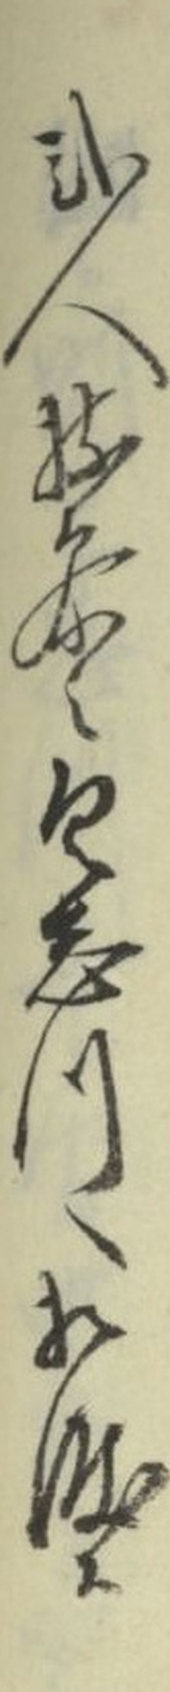弐人持参之具志川へ相渡す
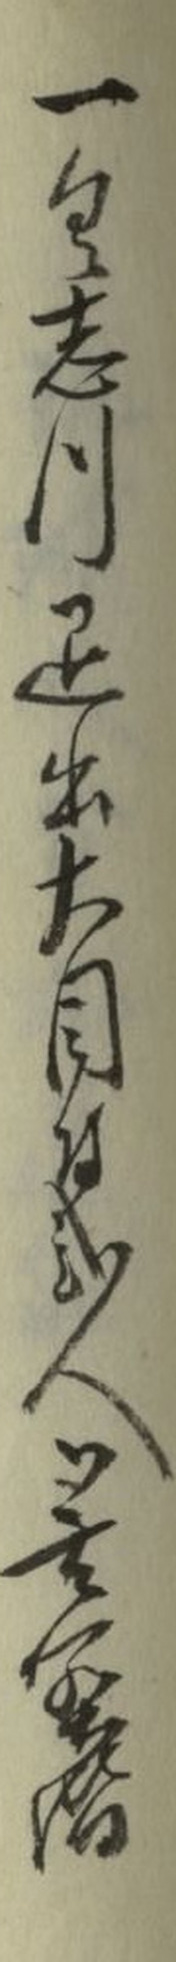一具志川退出大目付弐人御玄関階
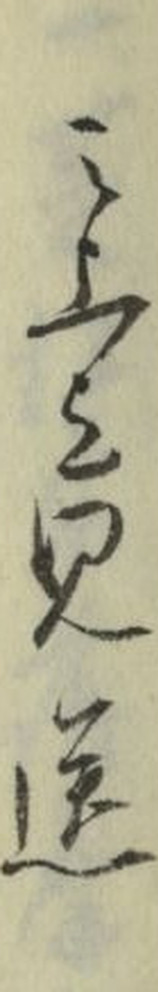之上迄見送
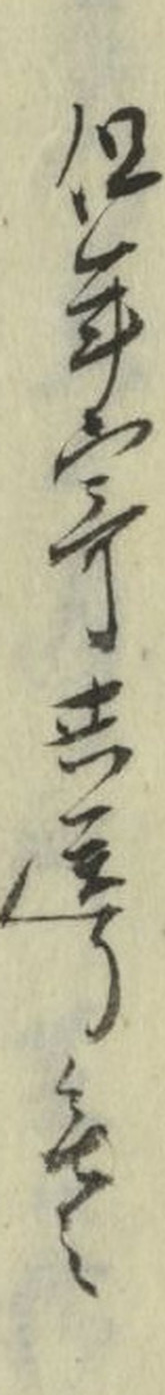但年寄共送り無之

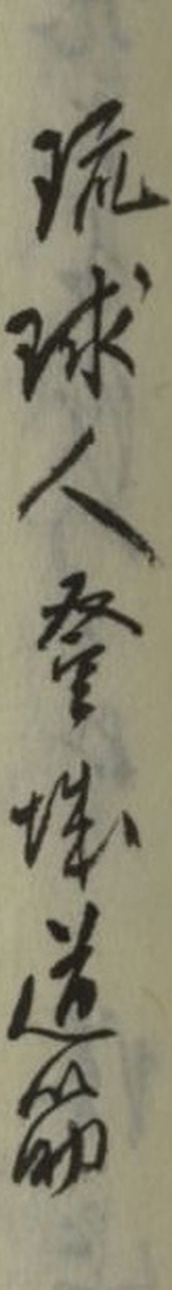琉球人登城道筋
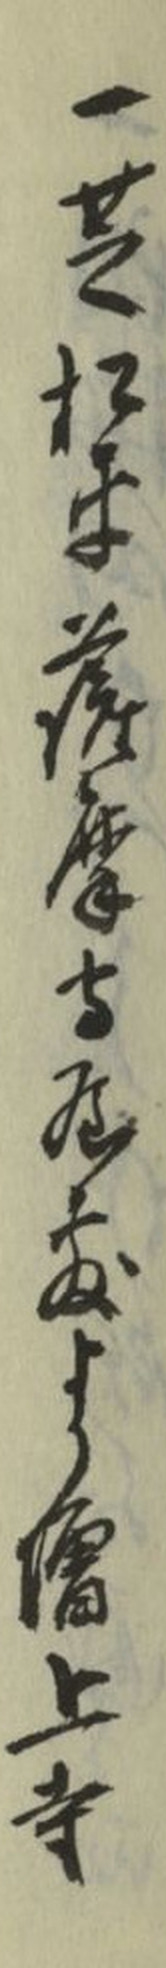一芝松平薩摩守屋敷より増上寺
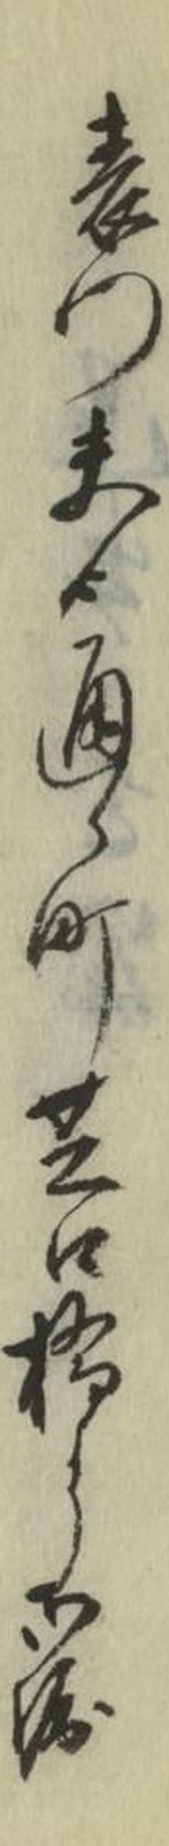表門夫ゟ通り町芝口橋より御堀
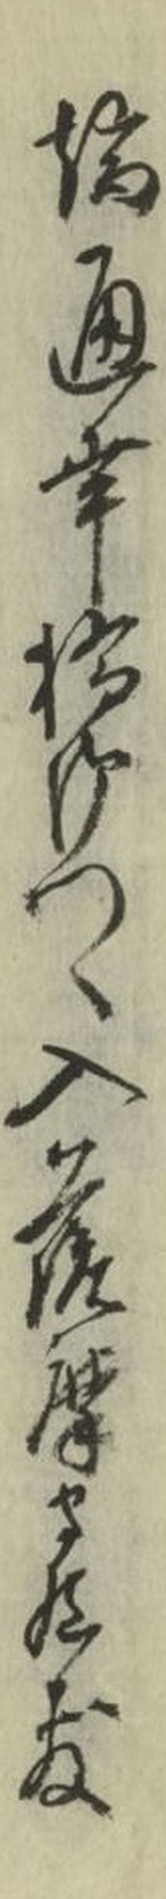端通幸橋御門へ入薩摩守屋敷
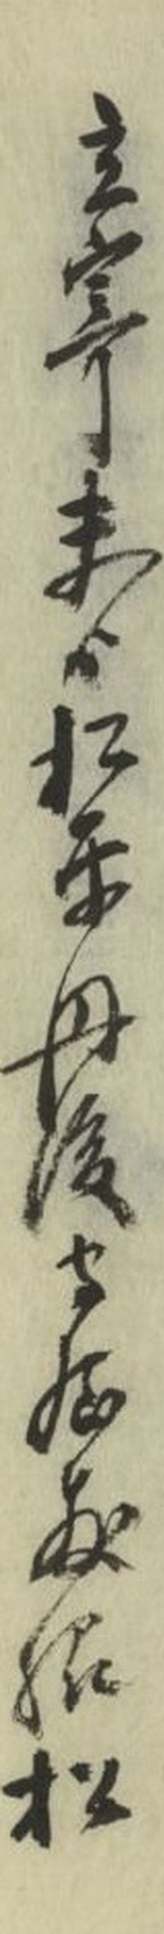立寄夫ゟ松平丹後守屋敷脇松
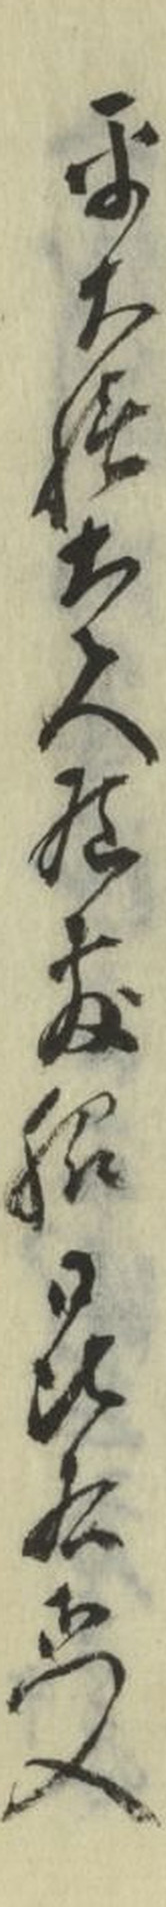平大膳大夫屋敷脇日比谷御門入

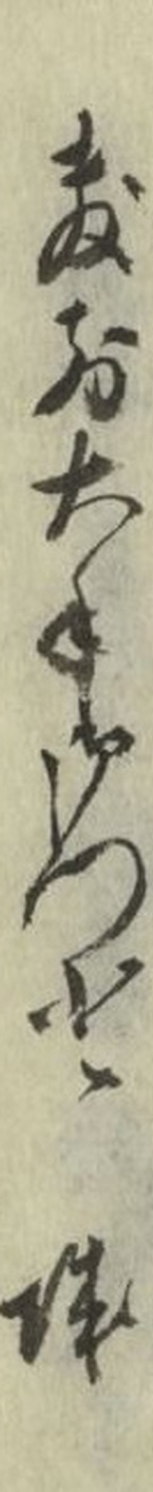敷前大手御門登城
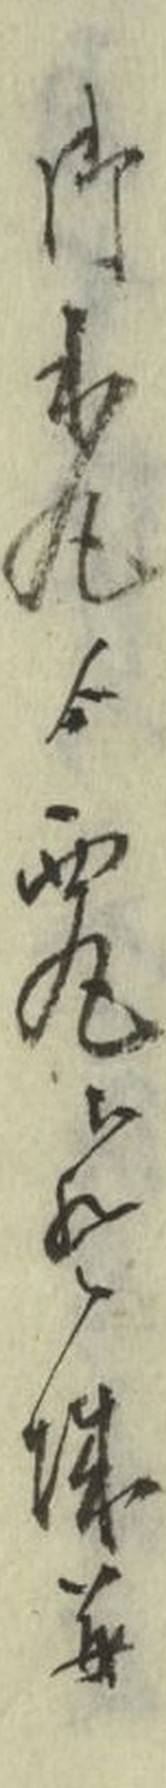御本丸ゟ西丸え登城幷
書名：琉球人来朝記 四之五
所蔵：University of the Ryukyus Library
